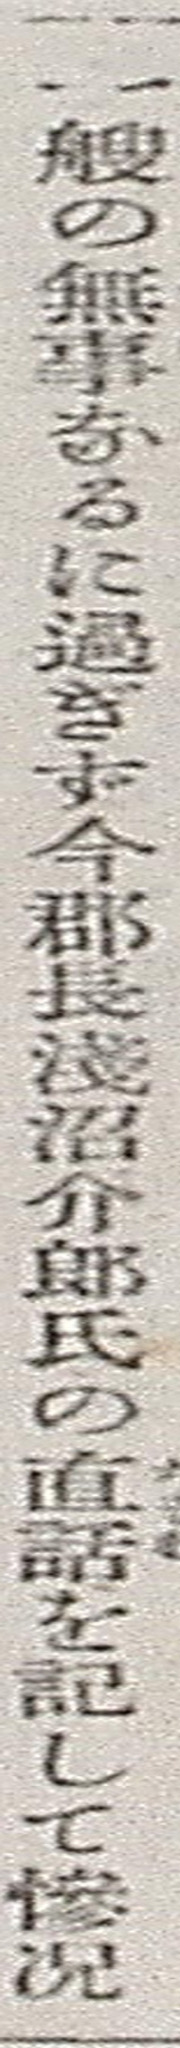一艘の無事なるに過ぎず今郡長浅沼介郎氏の直話を記して惨況
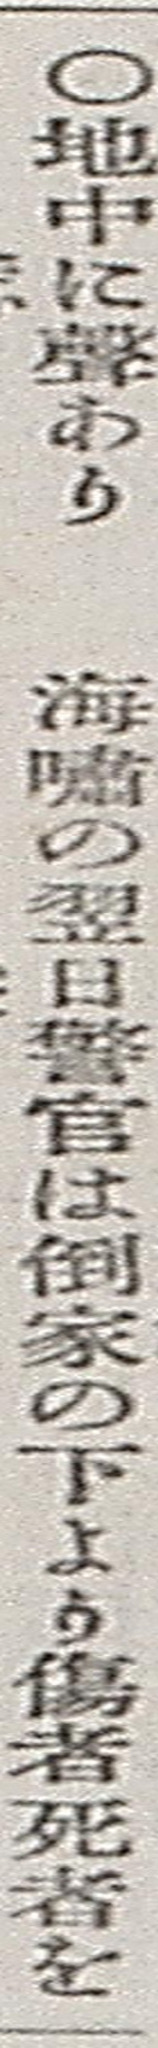○地中に声あり海嘯の翌日警官は倒家の下より傷者死者を
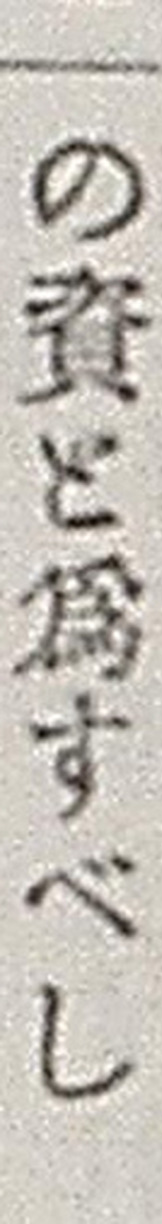の資と為すべし
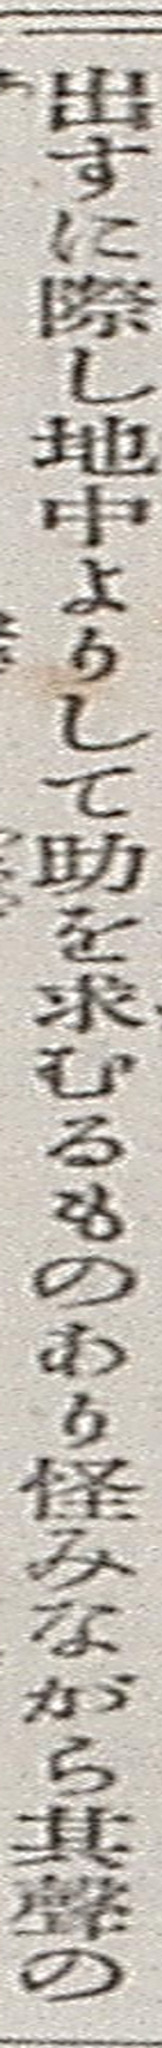出すに際し地中よりして助を求むるものあり怪みながら其声の
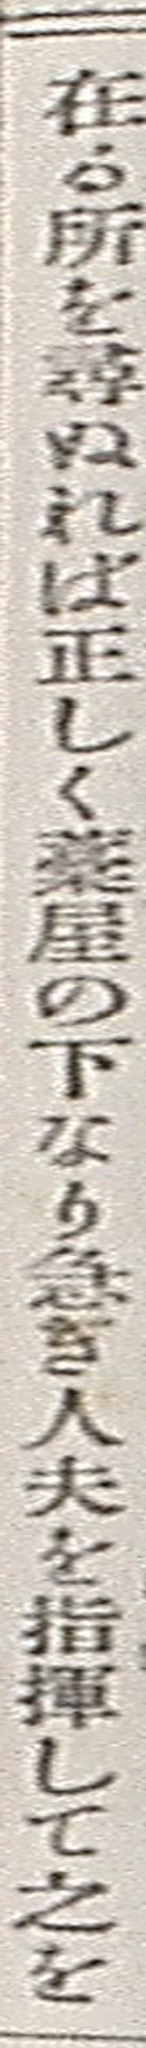在る所を尋ぬれば正しく藁屋の下なり急ぎ人夫を指揮して之を
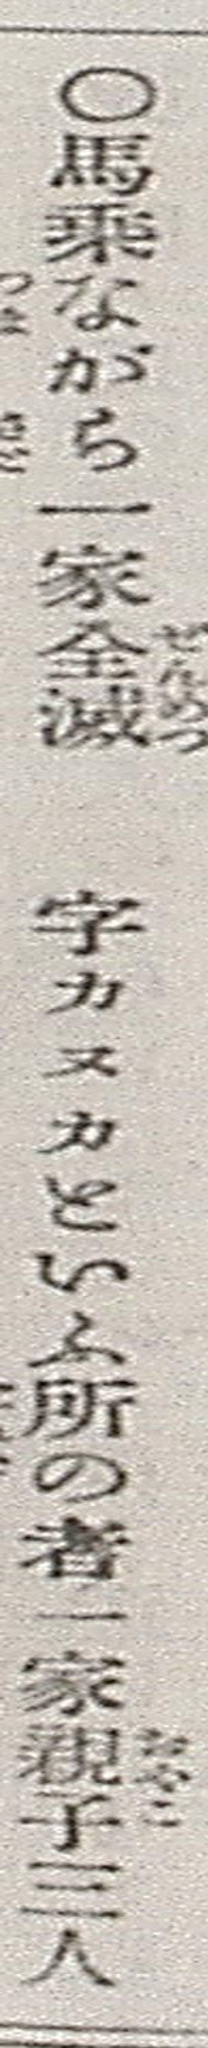○馬乗ながら一家全滅字カヌカといふ所の者一家親子三人
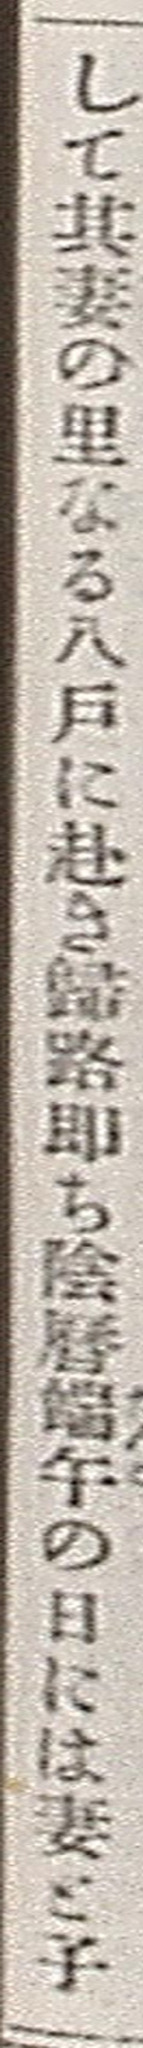して其妻の里なる八戸に赴き帰路即ち陰暦端午の日には妻と子

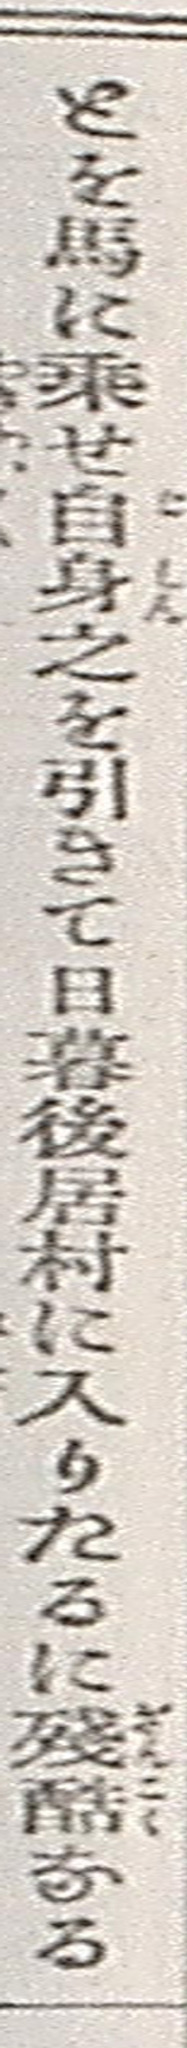とを馬に乗せ自身之を引きて日暮後居村に入りたるに残酷なる
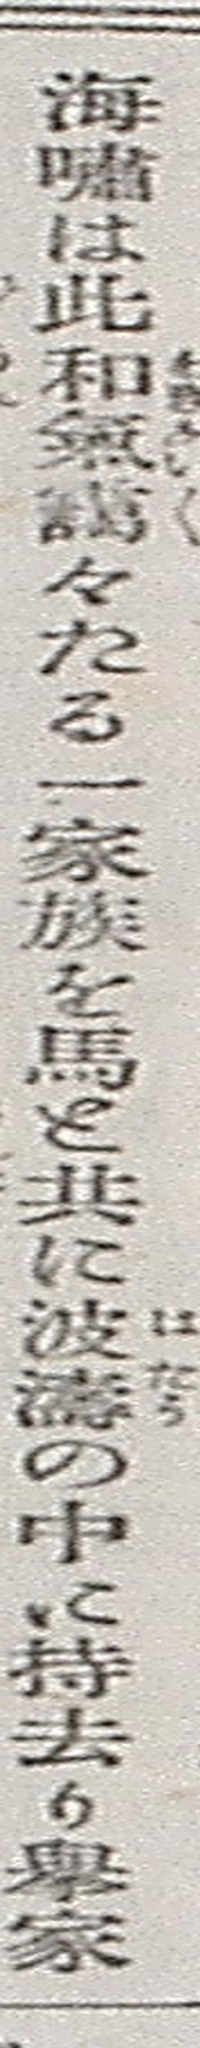海嘯は此和気靄々たる一家族を馬と共に波濤の中に持去り挙家
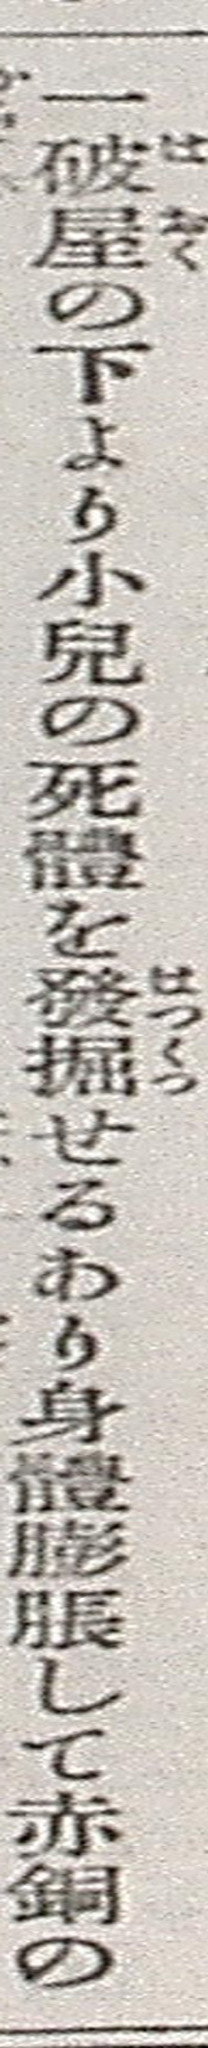一破屋の下より小兒の死骸を発掘せるあり身体膨脹して赤胴の
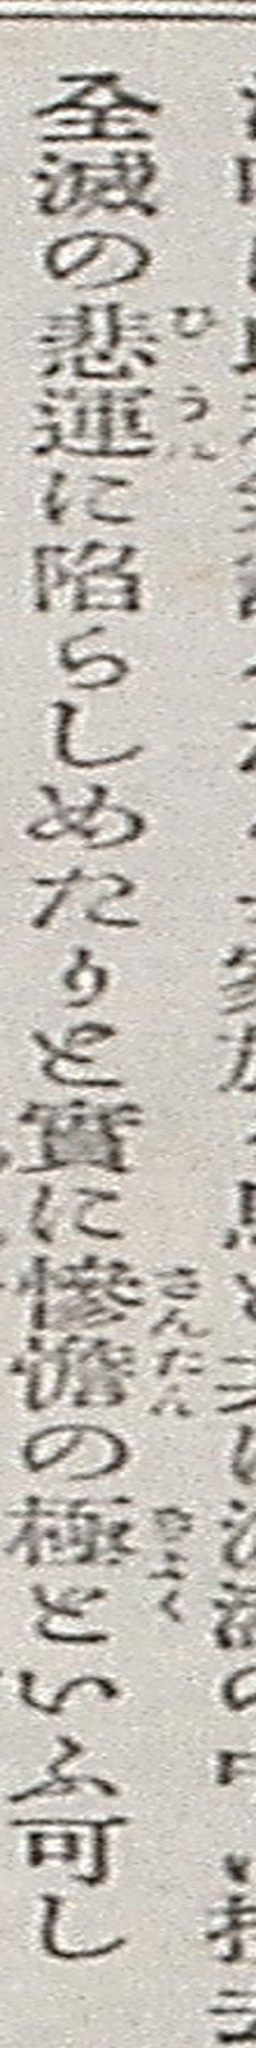全滅の悲運に陥らしめたりと実に惨憺の極といふ可し
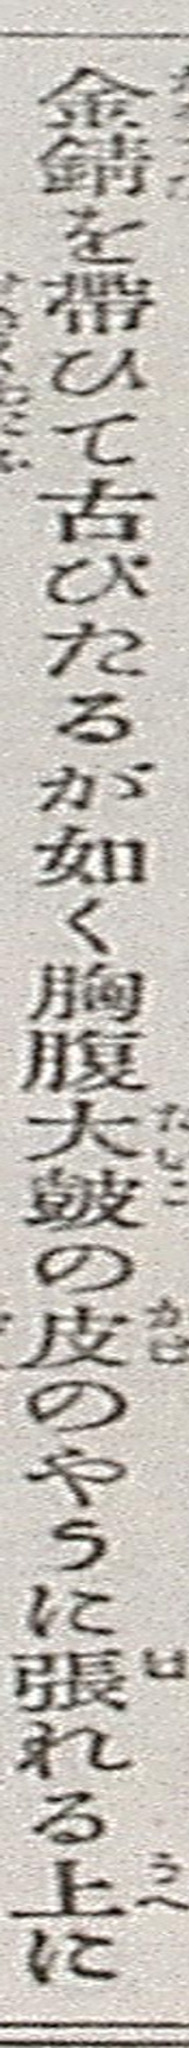金錆を帯ひて古びたるが如く胸腹大皷の皮のやうに張れる上に
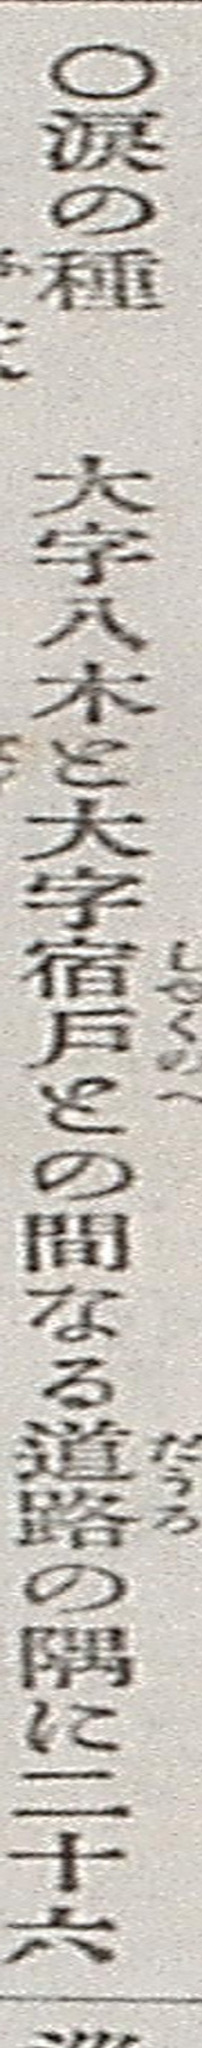○涙の種大字八木と大字宿戸との間なる道路の隅に二十六
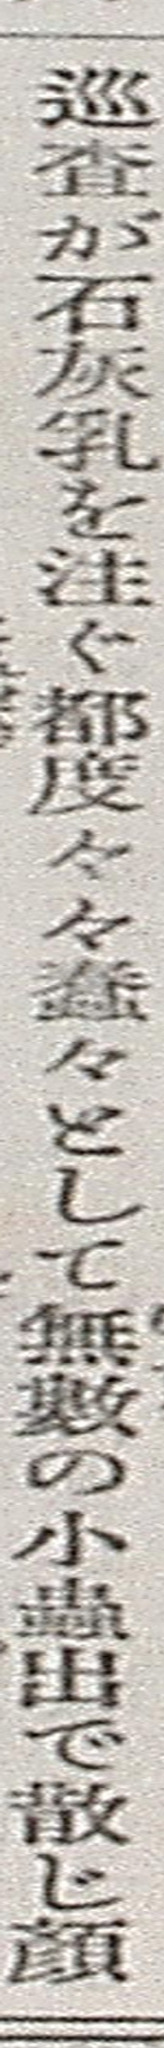巡査が石灰乳を注ぐ都度々々蠢々として無数の小蟲出で散じ顔
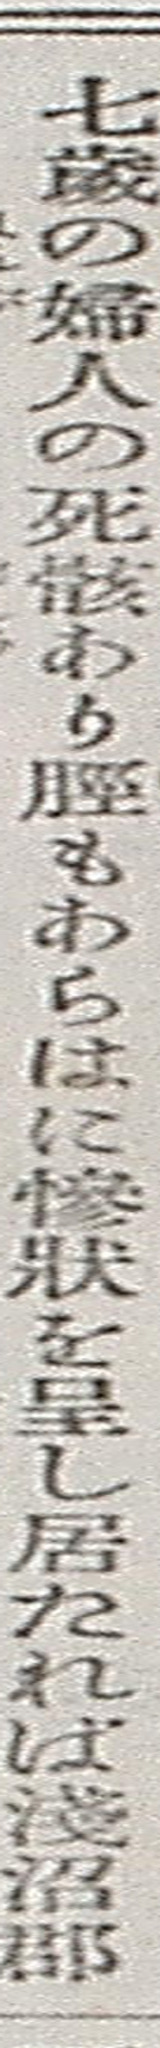七歳の婦人の死骸あり脛もあらはに惨状を呈し居たれば浅沼郡
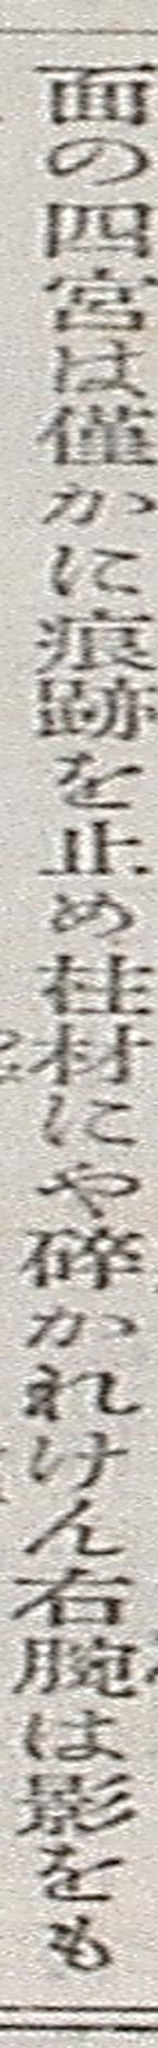面の四宮は僅かに痕跡を止め柱材にや砕かれけん右腕は影をも
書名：風俗畫報臨時増刊第百二十號　大海嘯被害録（下）
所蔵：東京大学地震研究所図書室 Earthquake Research Institute Library, The University of Tokyo, JAPAN
